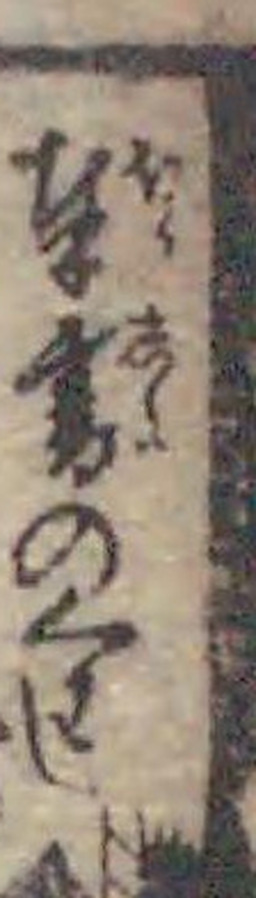奉書のくわし袋
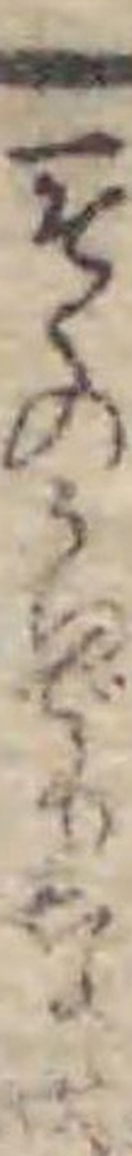一そくのうちでもしよ
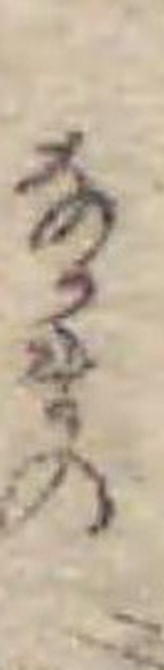なかまの
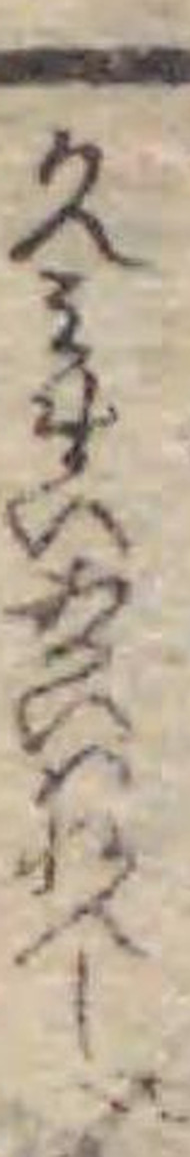かんみまいあかいはねんし
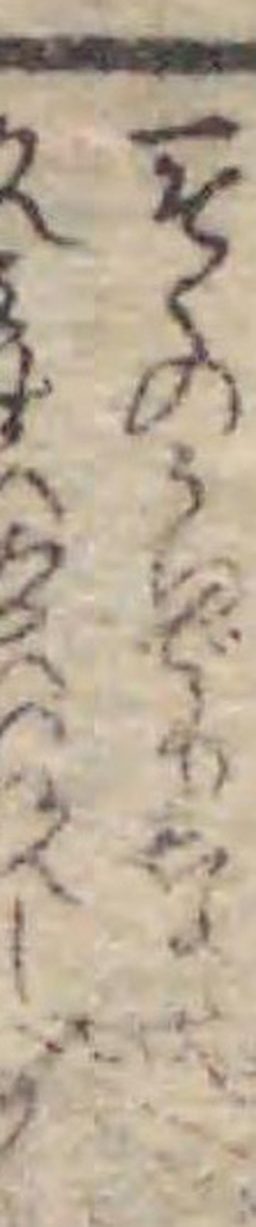かんみまいあかいはねんし
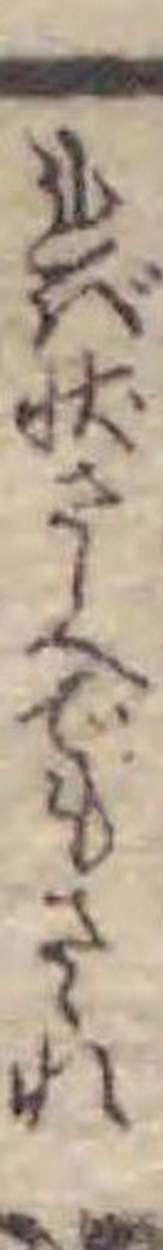れば状さしへでもさゝれ
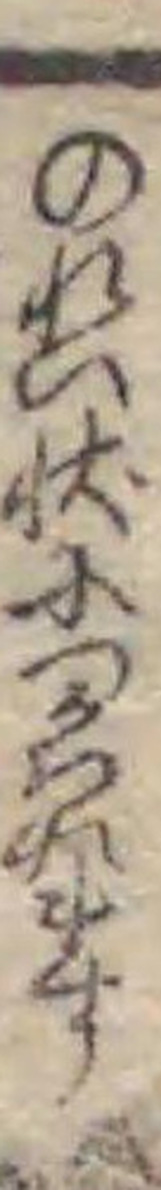のれい状につかはれます
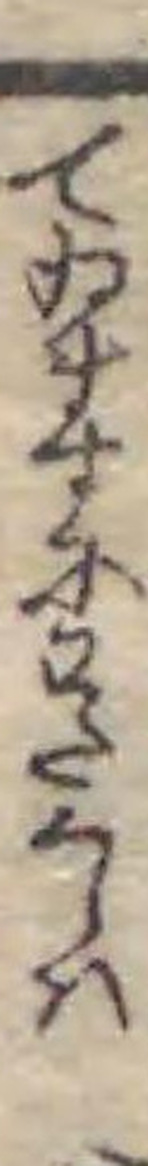てゐますにわたくしは
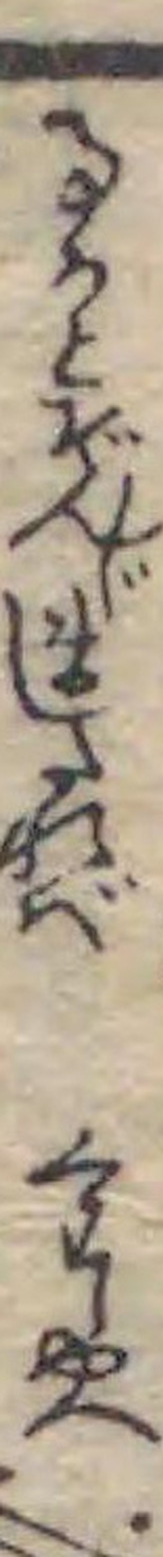事かとぞんじましたればくわしやへ
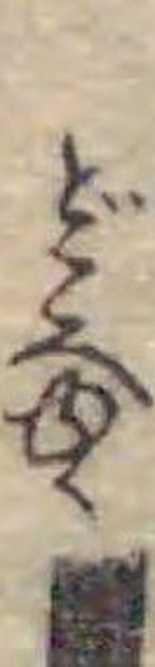どこへゆく
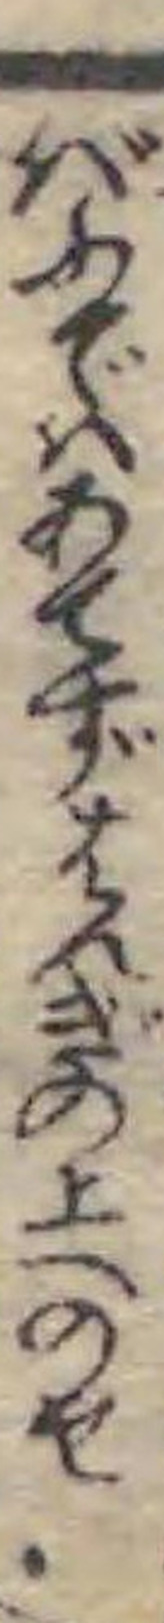ばふではあてずはんぎの上へのせ
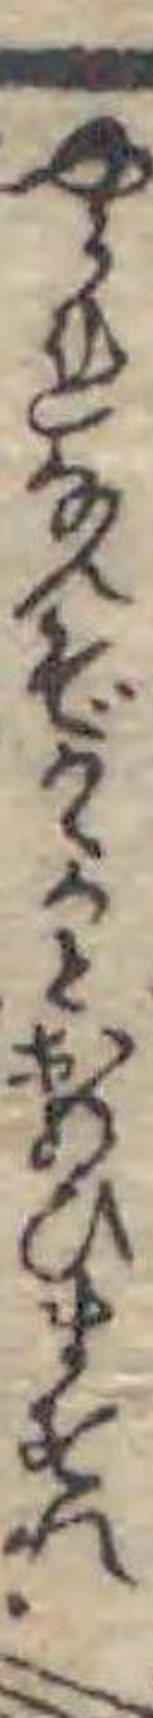やられなんぞかくかとおもひますれ
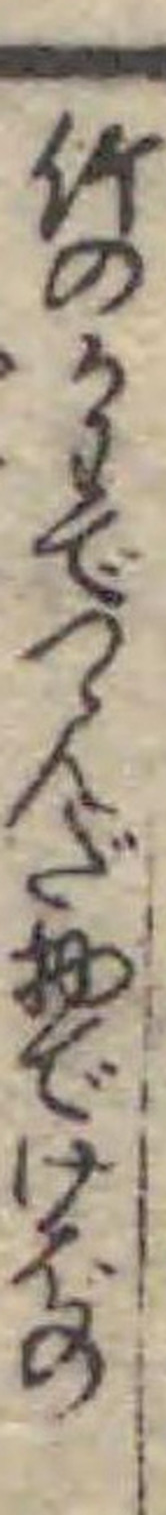竹のかわでつゝんだ物でけばの
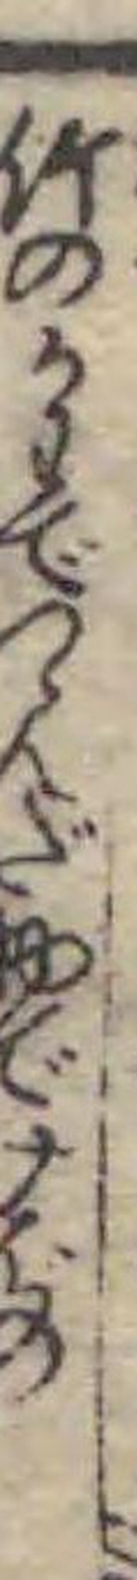竹のかわでつゝんだ物でけばの
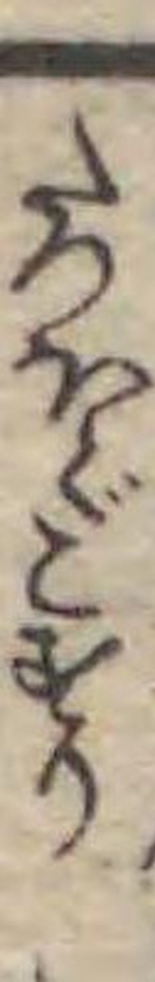たつほどこすり
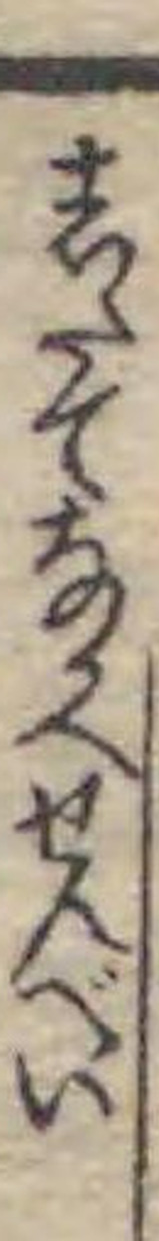したてなかへせんべい
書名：紙屑身上噺 : 3巻
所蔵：国立国会図書館 National Diet Library, JAPAN
